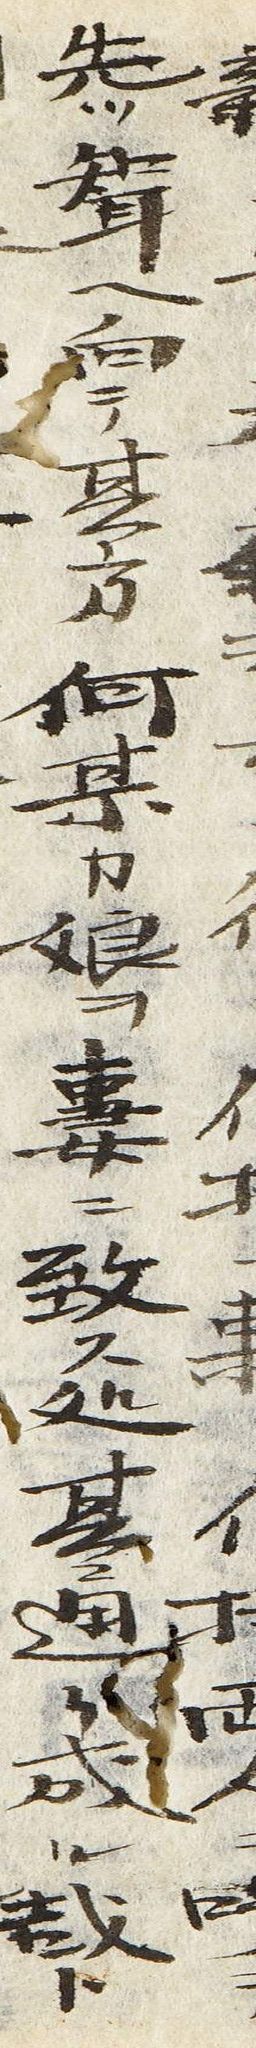先ツ聟ヘ向テ其方何某カ娘ヲ妻ニ致ス処其通リ成ル哉ト
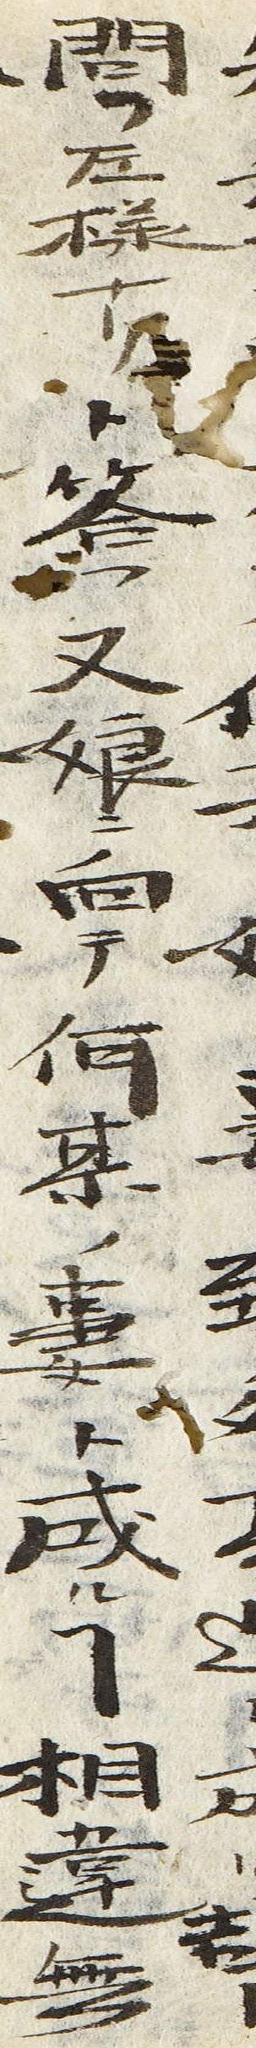問フ左様ナリト答フ又娘ニ向テ何某ノ妻ト成ルヿ相違無
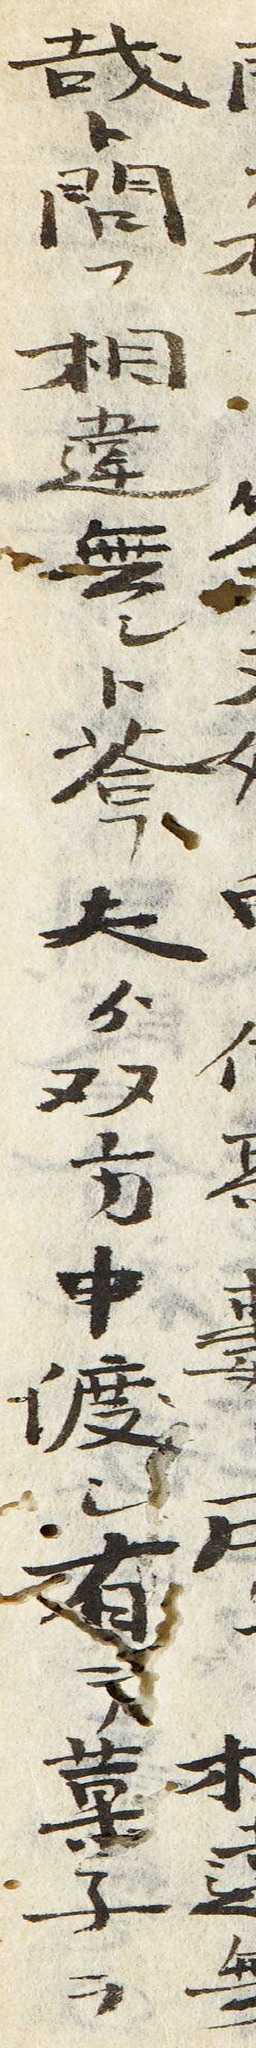哉ト問フ相違無シト答フ夫ゟ双方申渡シ有テ菓子ヲ

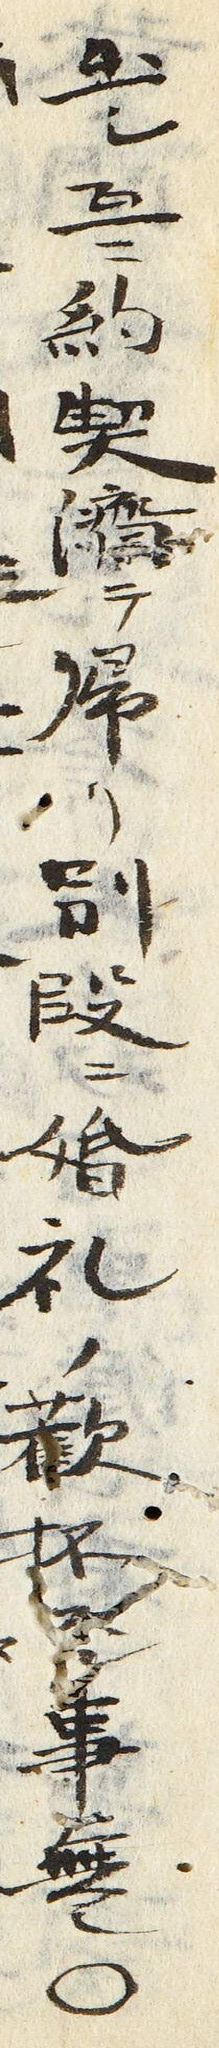出シ互ニ約契済テ帰リ別段婚礼ノ歓杯スル事無シ〇
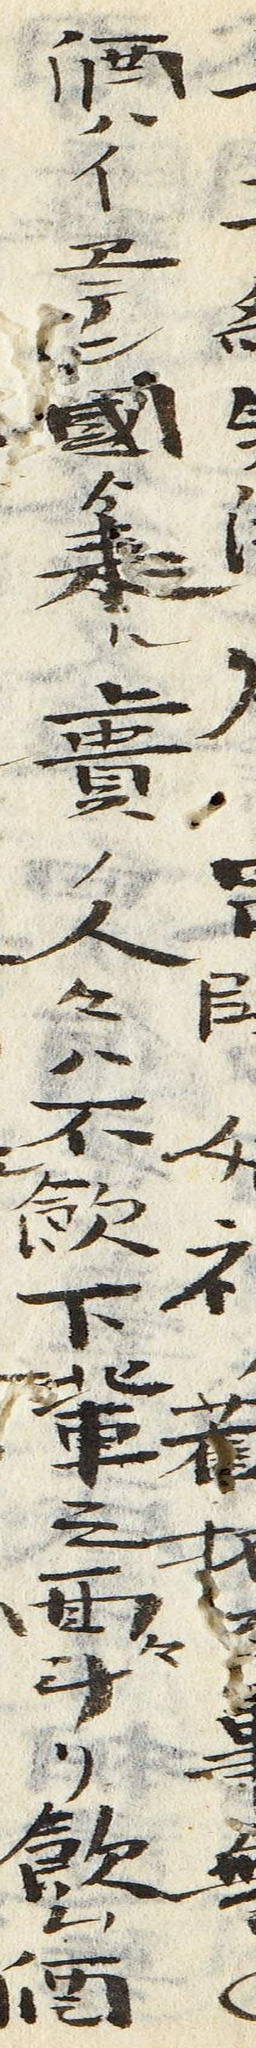酒ハイエテン国ゟ来ル上貴ノ人々ハ不飲下輩之面々計リ飲ム酒
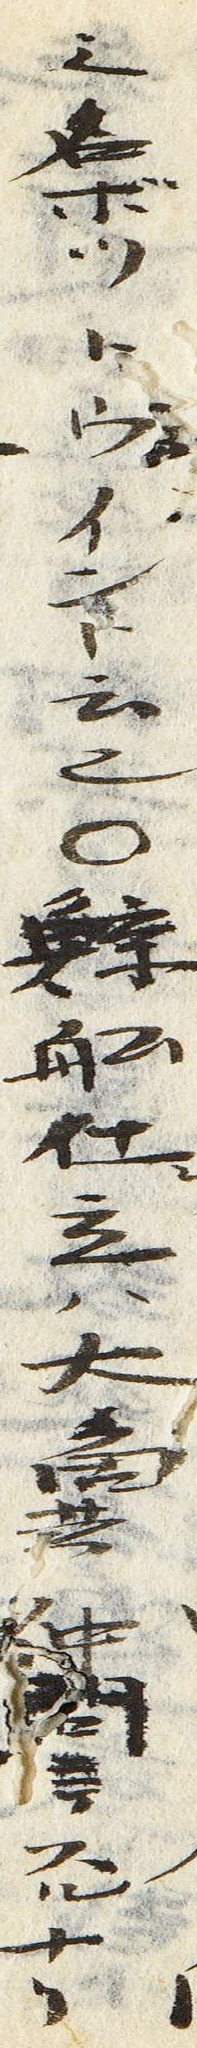之名ボツトウイント云也〇鯨船仕立ハ大商共仲間ニテスルナリ
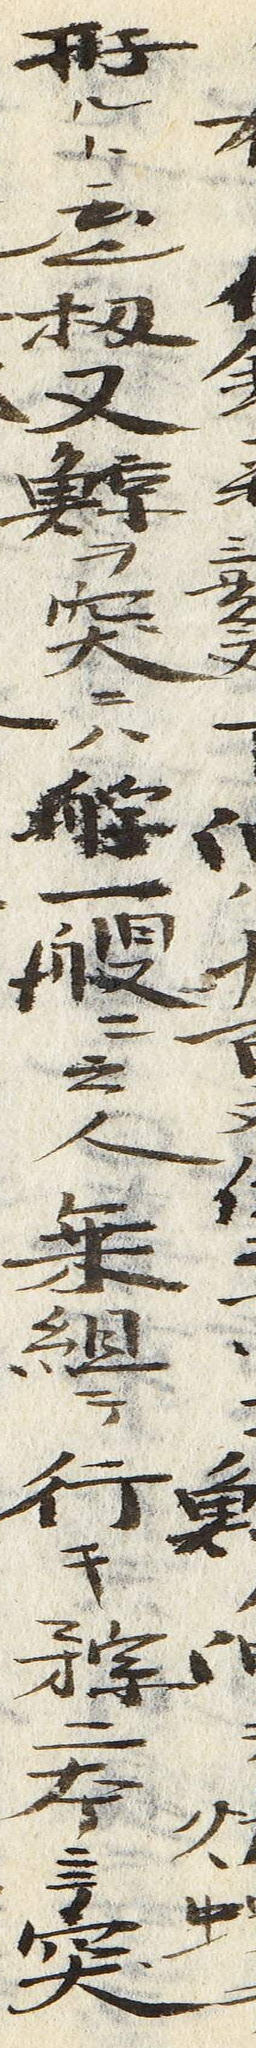拵ルト云也扨又鯨ヲ突ニハ艀一艘ニ六人乗組テ行キ二本ニテ突
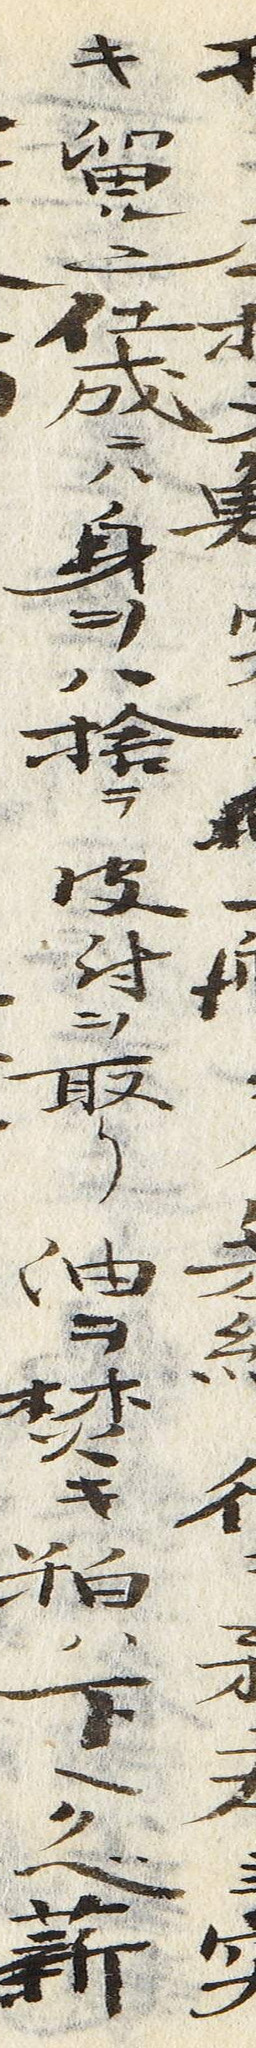キ留ル也仕成ニハ身ヲハ捨テ皮付ヲ取リ油ヲ焚キ粕ハ下ヘクベ薪
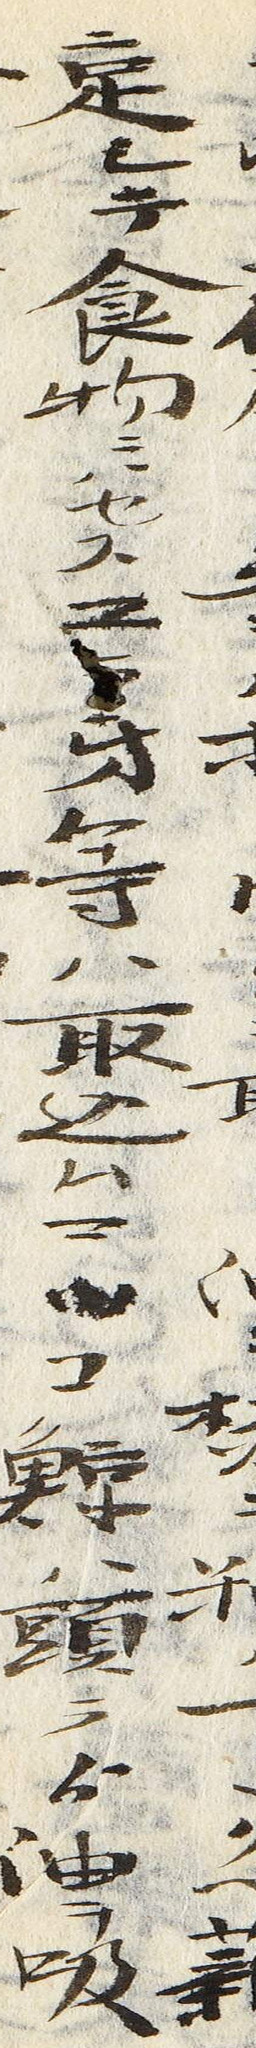ニ足シテ食物ニハセス牙等ハ取込ムマツコ鯨ハ頭ヲゟ油ヲ吸
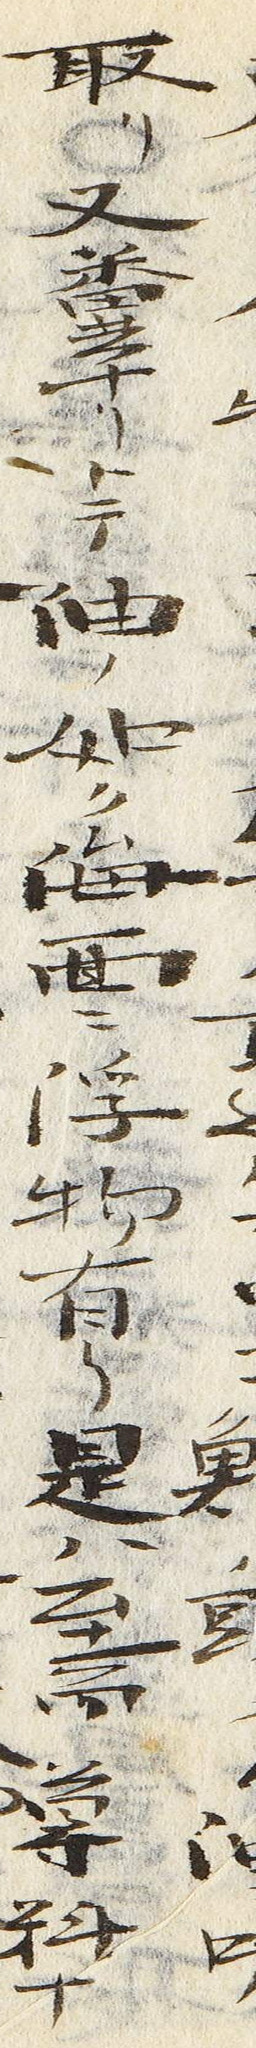取リ又番共ナリトテ油ノ如ク海面ニ浮物有リ是ハ至而尊料ナ
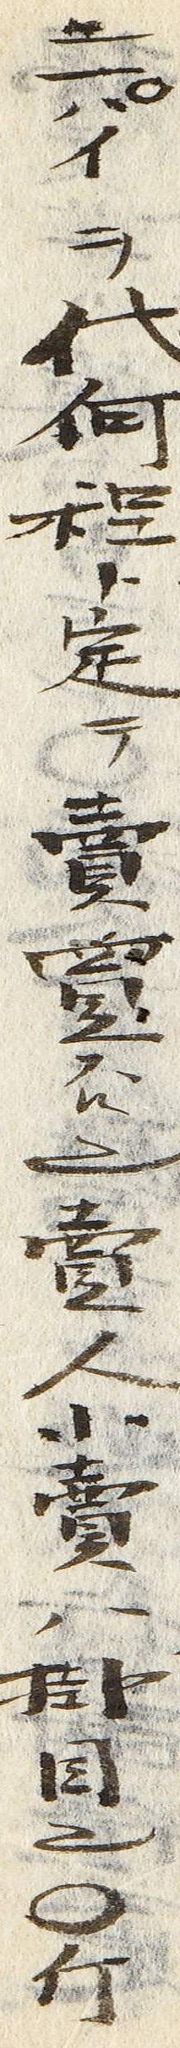ニ一パイヲ代何程ト定テ売賈スル也売人小売ハ掛目也〇斤
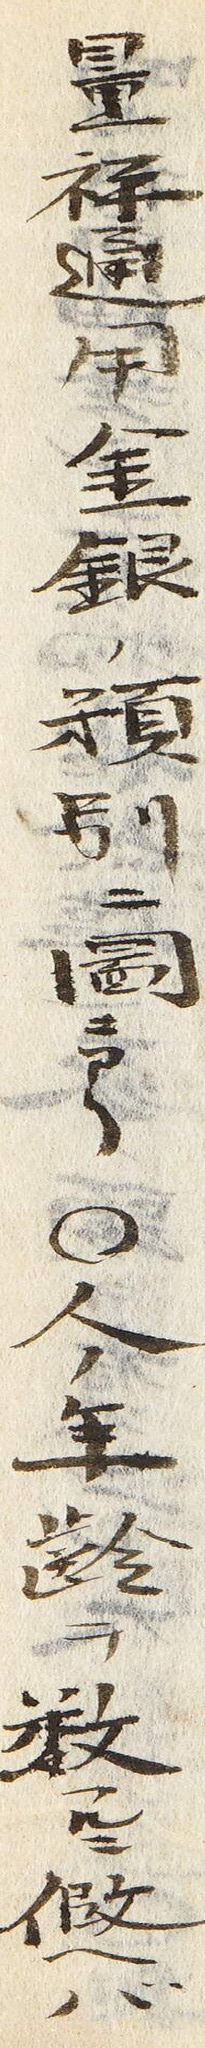量秤通用金銀ノあ預別ニ図ニアリ〇人ノ年齢ヲ数フルニ假ヘバ
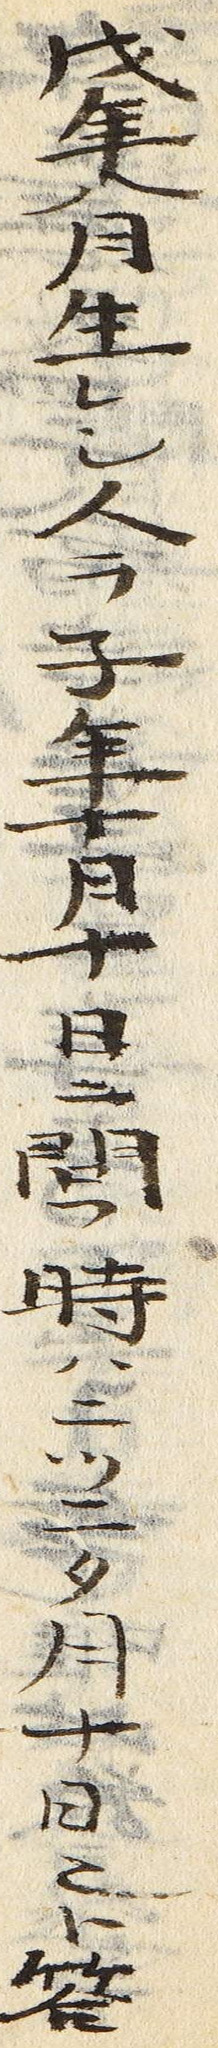戌年八月生レシ人ヲ子年十月十日ニ問フ時ハ二ツ二タ十日也ト答
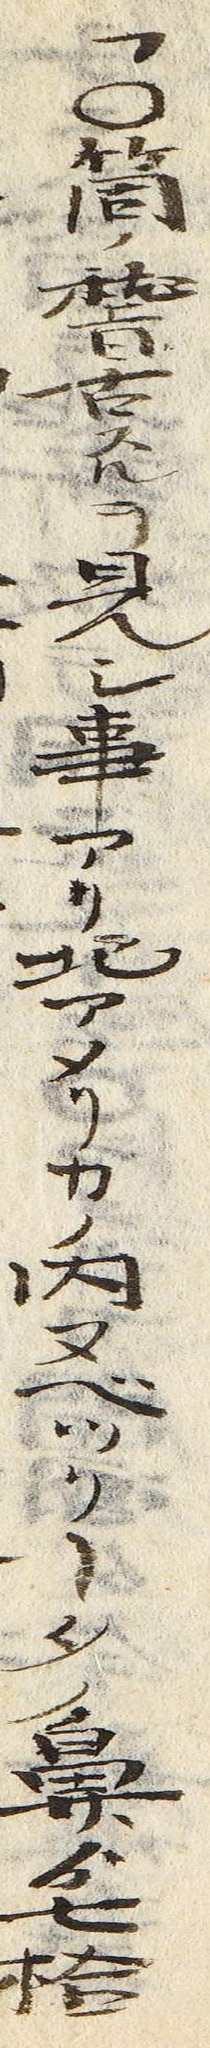フ〇筒ノ稽古スルヲ見シ事アリ北アメリカノ内ヌベツク❘タノ鼻ゟ
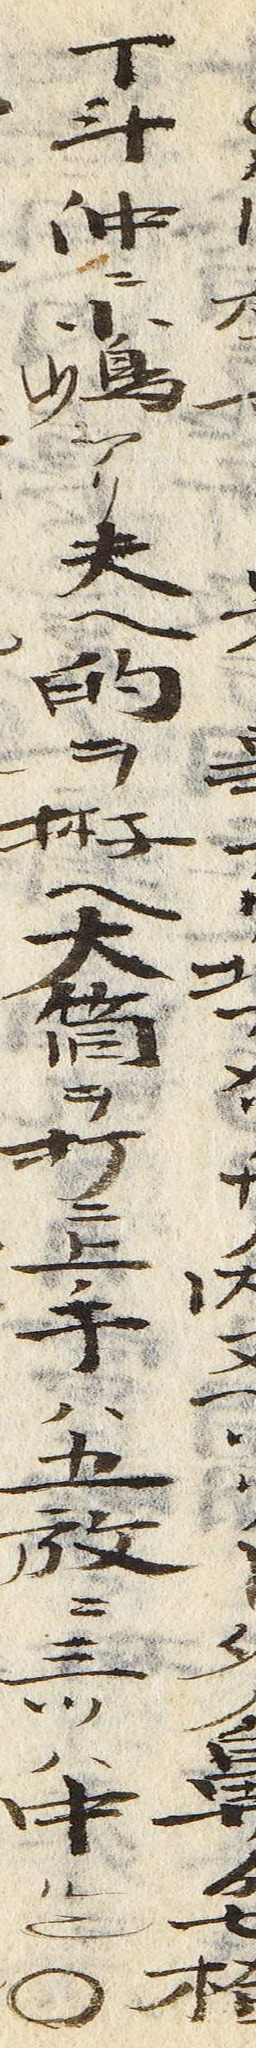丁計沖ニ小嶋アリ夫ヘ的ヲ拵ヘ大筒ヲ打ニ上手ハ五放ニ三ツハ中ル也〇
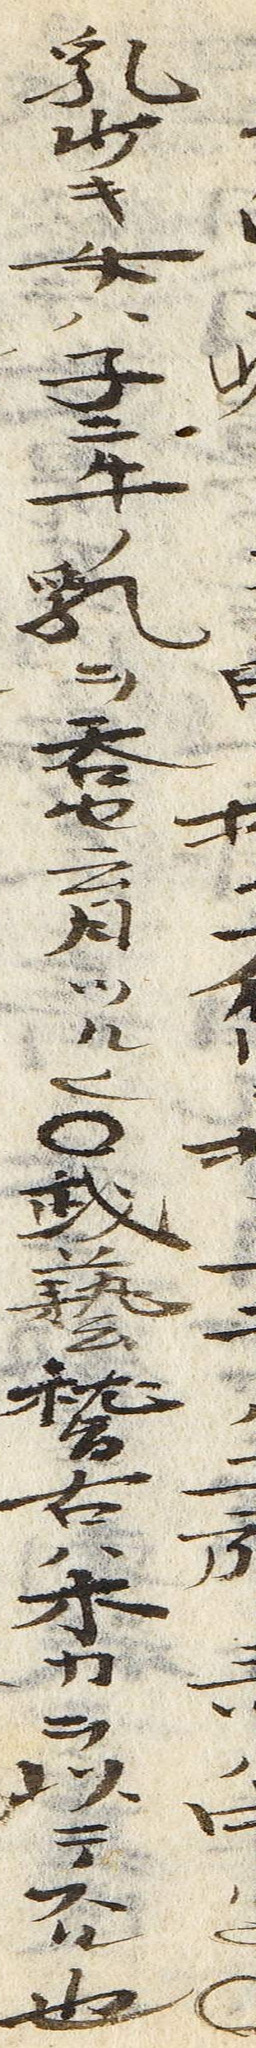乳少キ女ハ子ニ牛ノ乳ヲ吞セ育ツル也〇武芸稽古ハ木刀ヲ以テスル
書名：漂流記聞
